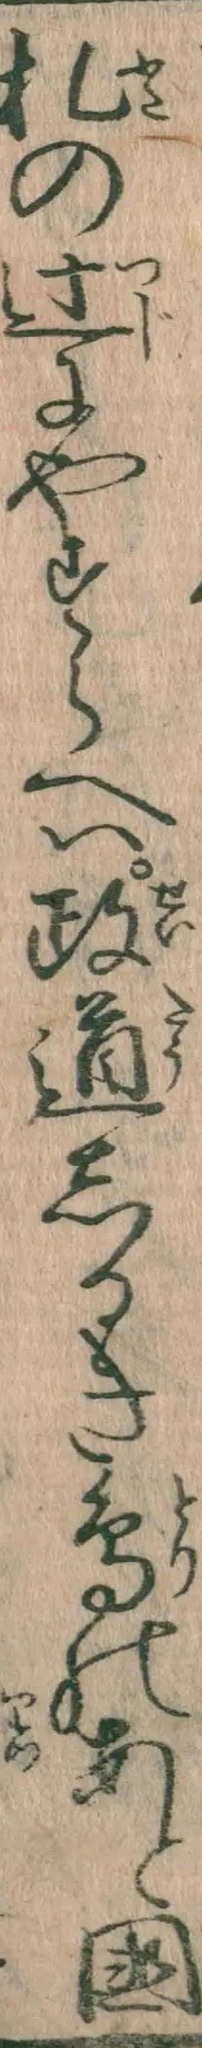札の辻にやすらへは。政道しるき鳥のあと国
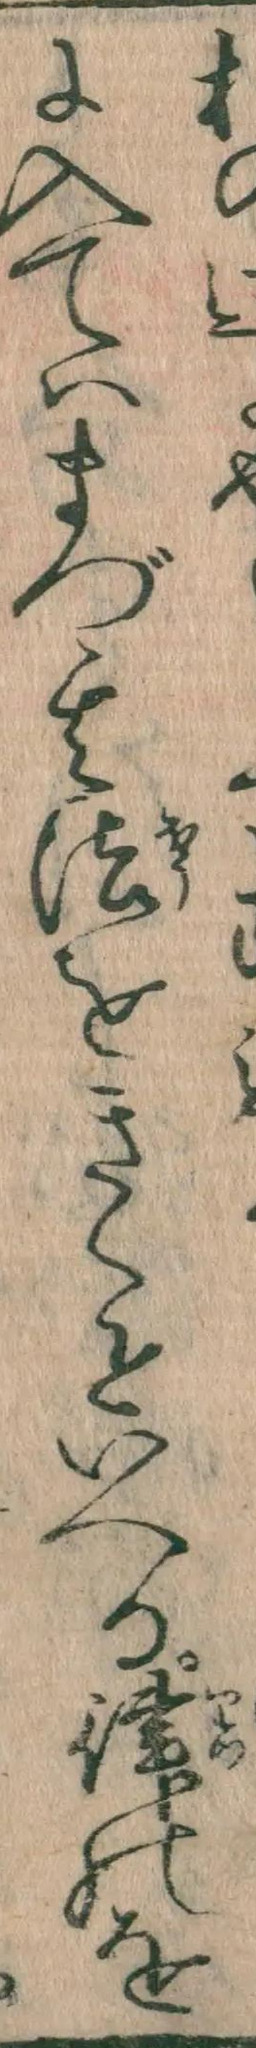に入てはまづ其法をきくといへる。律のを
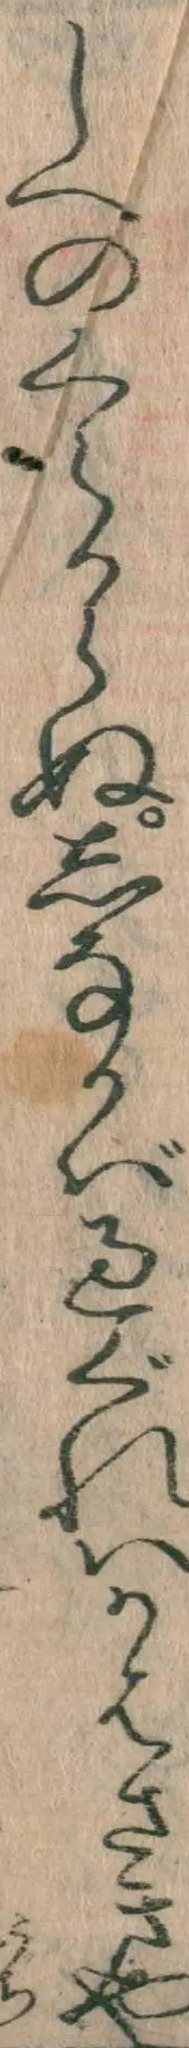しへのくらからぬ。しなかば過ぐれはかはさきや
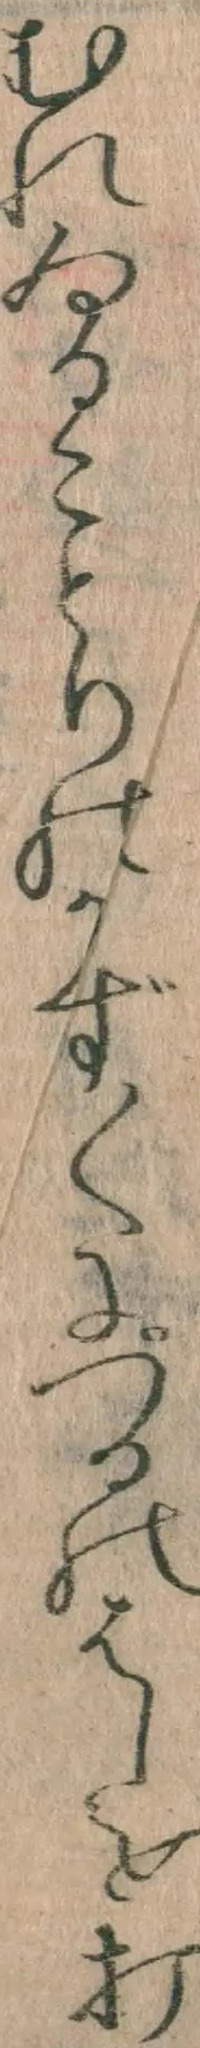むれゐることりのかず〳〵に。つるのはしを打

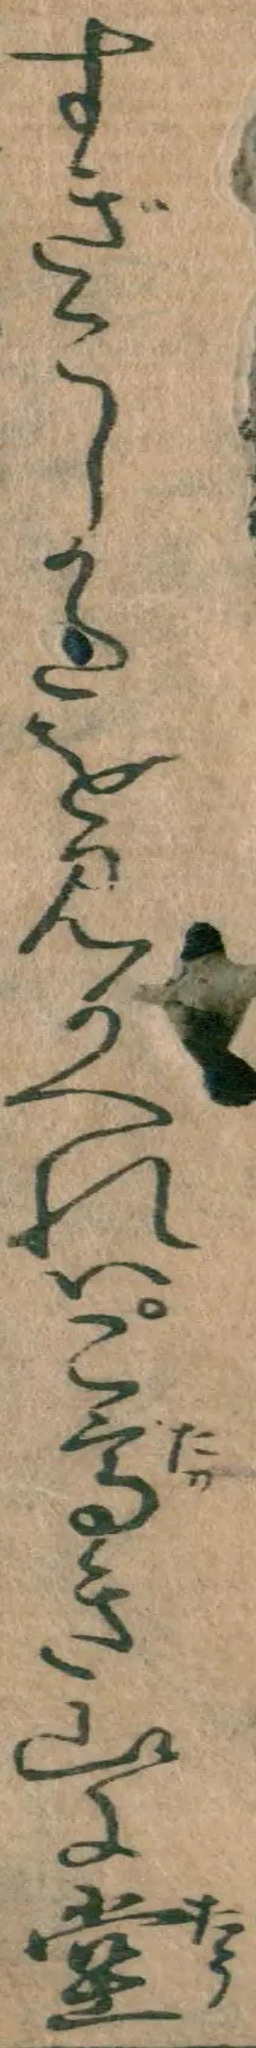すぎこしかたを見かへれは。こ高き山に堂
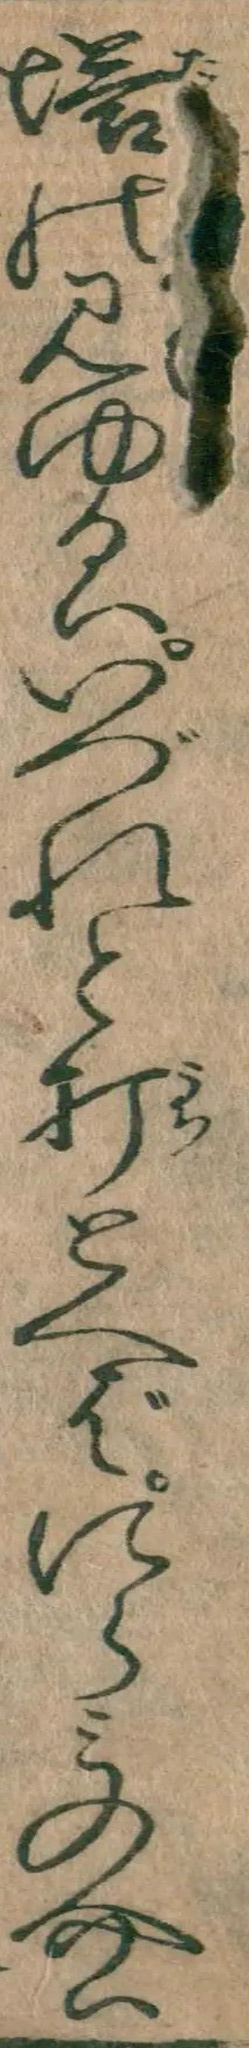搭の見ゆるは。いづれと打とへば。にらみの介は
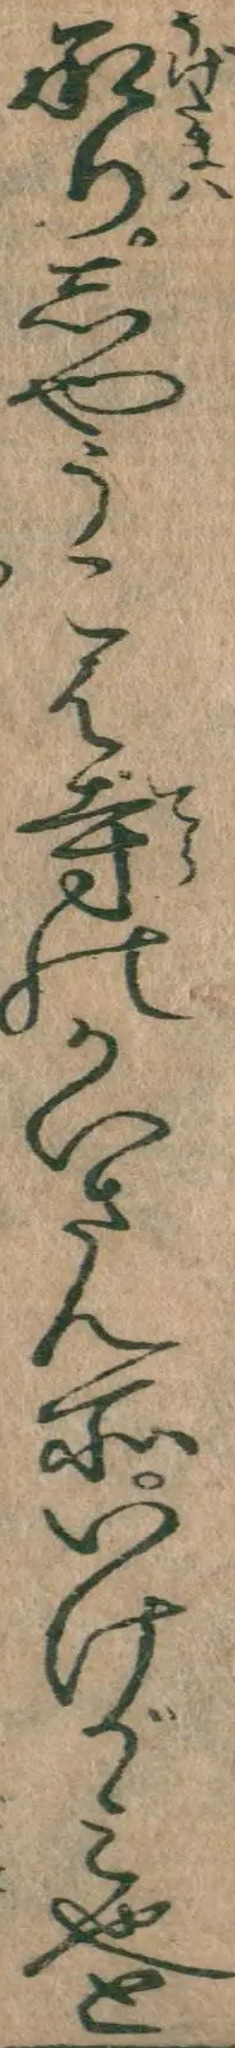承り。しやうこは寺のかいさん所。いけがみ也と
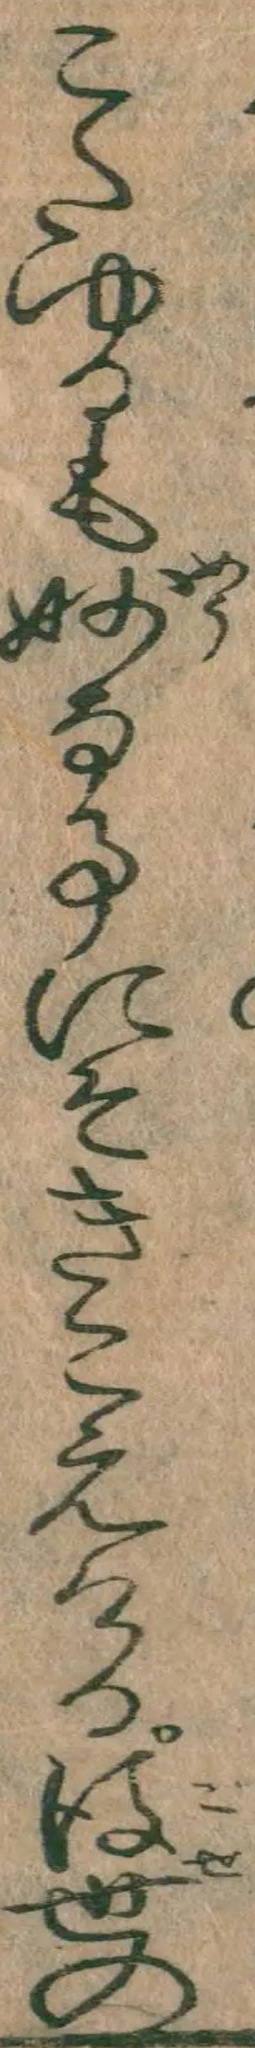こたゆるも妙な事にそきこえける。後世の
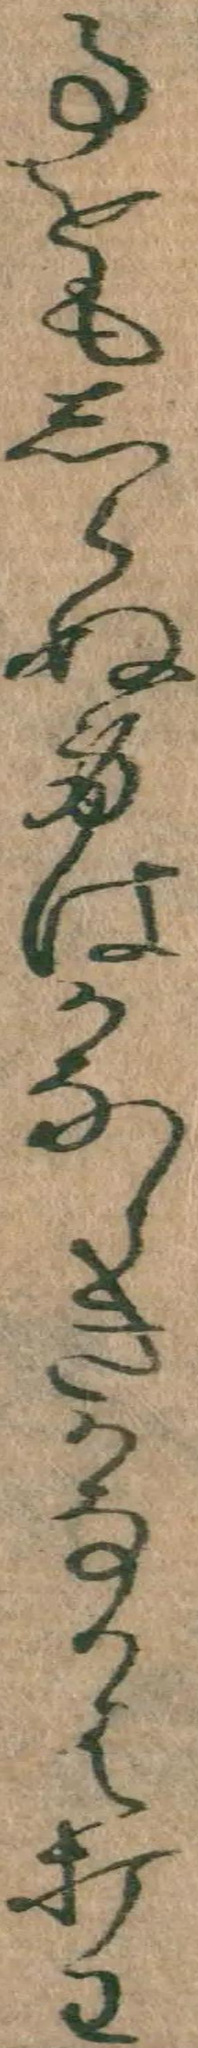事をもしらぬ身はかなしきかなかは打わ
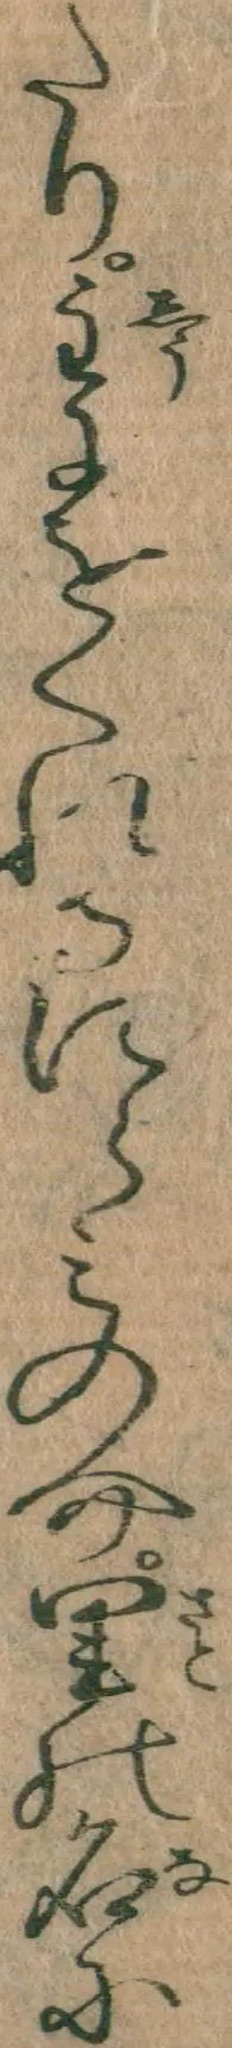たり。主にをくれるにらみの介。里の名に
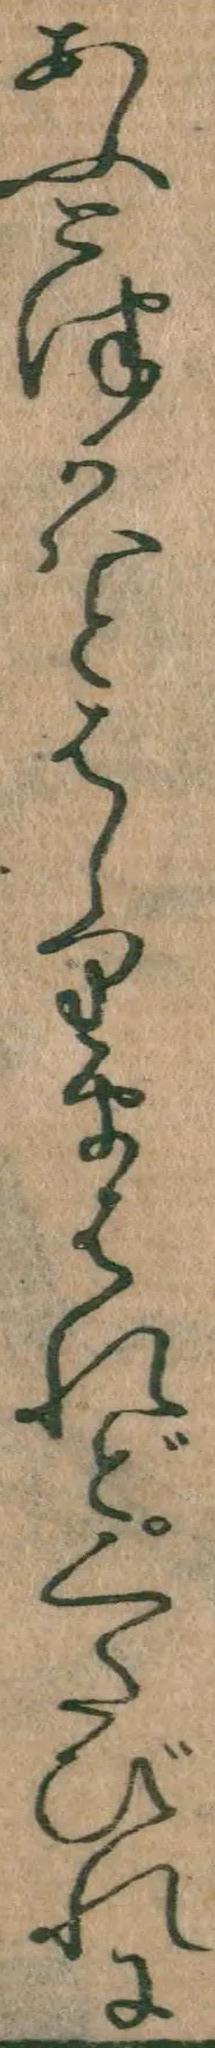あふとつかはとはしりまはれど。くたびれに
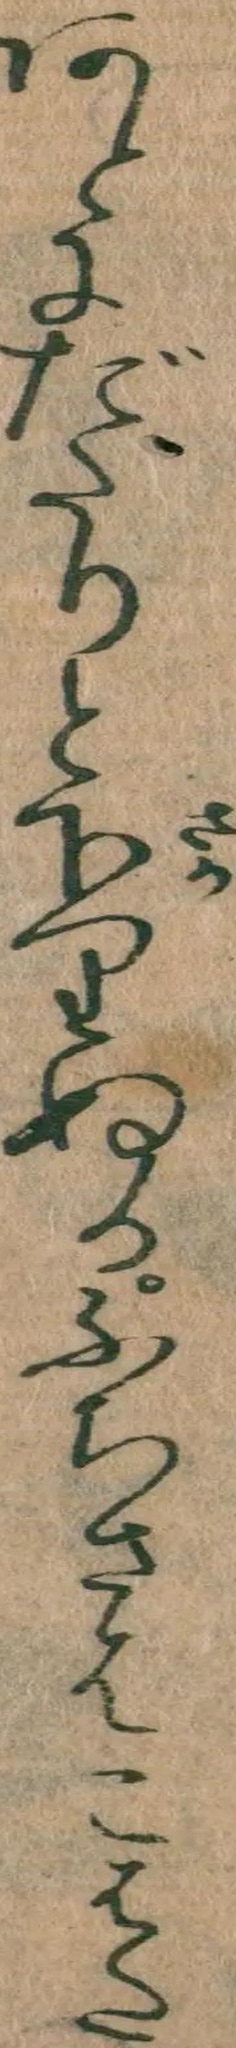あとにだたりと下りぬる。ふちさはこはた
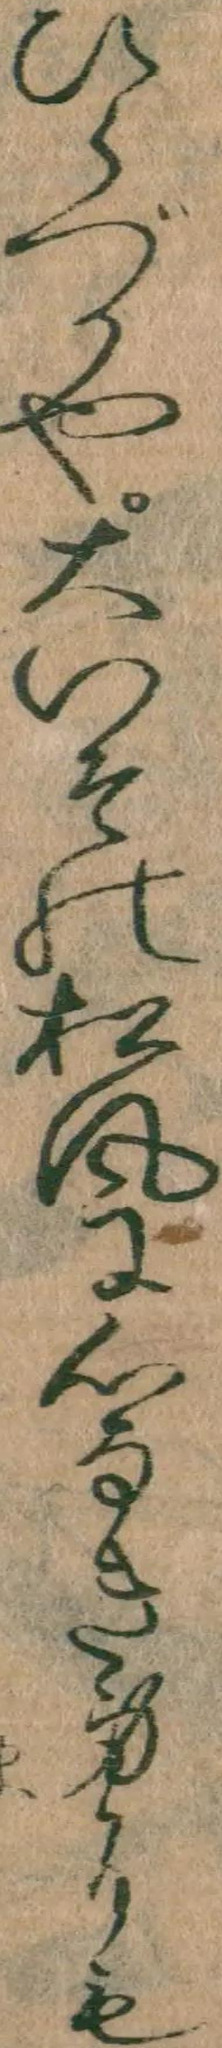ひらづかや。大いその松風に心なき身にも
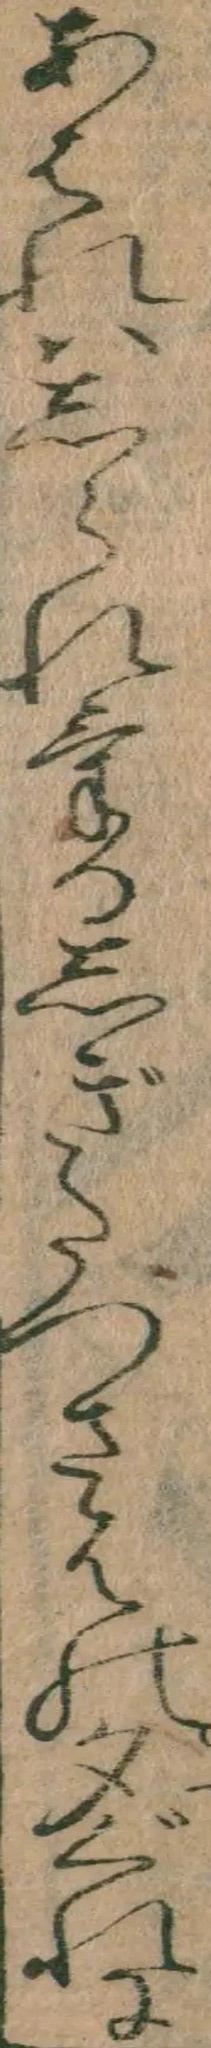あはれはしられけるしぎたつさはの夕ぐれに
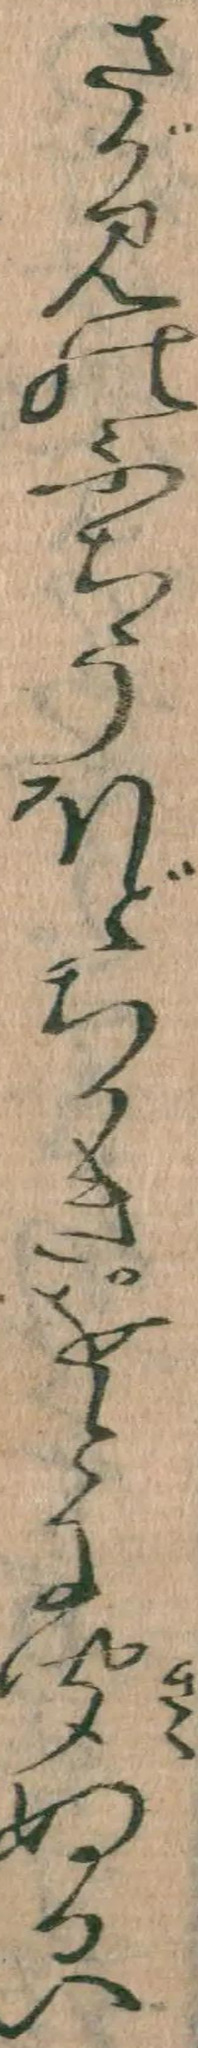さがみのふちうほどちかき。をとに聞ぬるい
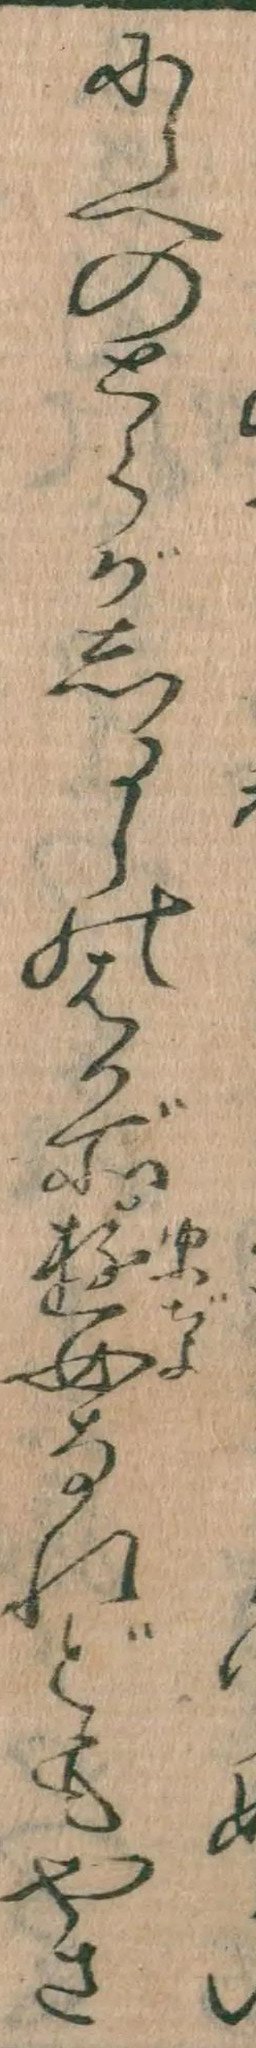にしへのとらがしるしのはか”所。遊女なれどもやさ
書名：竹斎狂歌物語 3巻
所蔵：国立国会図書館 National Diet Library, JAPAN
